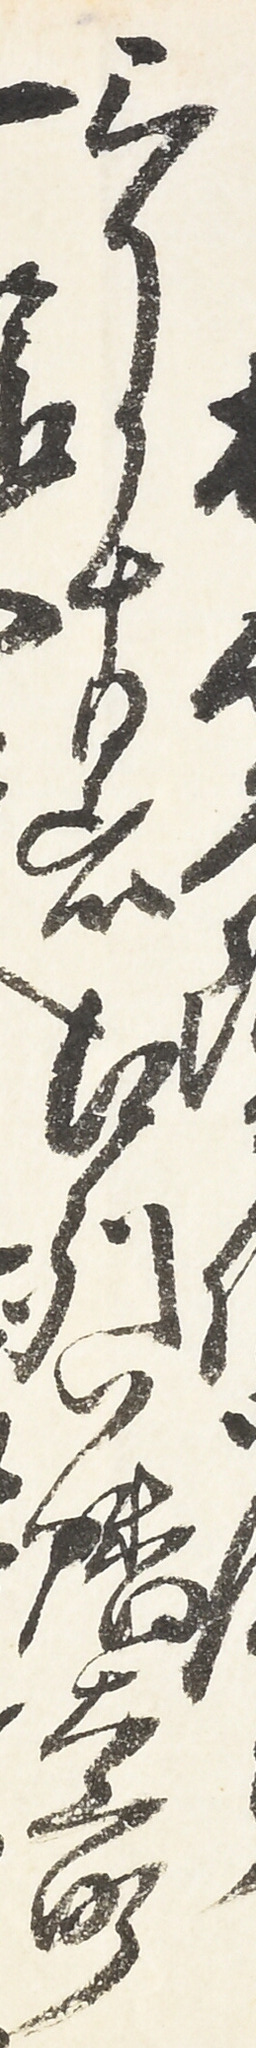三月十日着江州八幡大工町
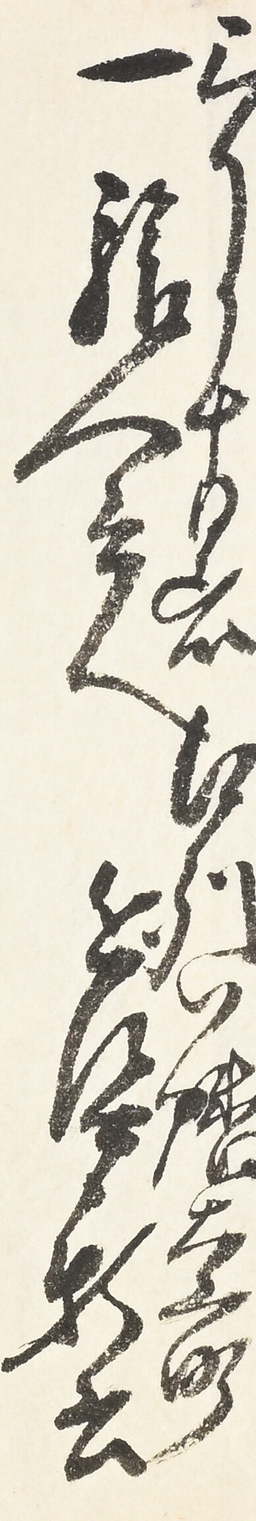一旅人壱人近江や新六
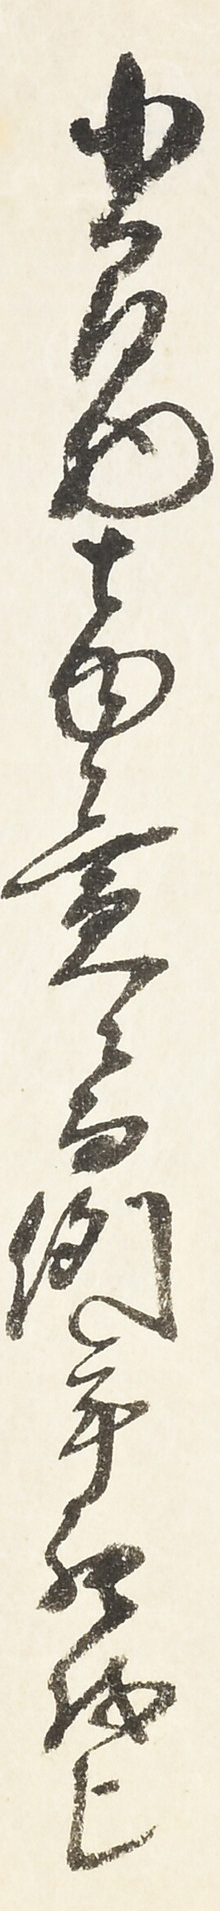小間物商売ニ而例年罷越申候
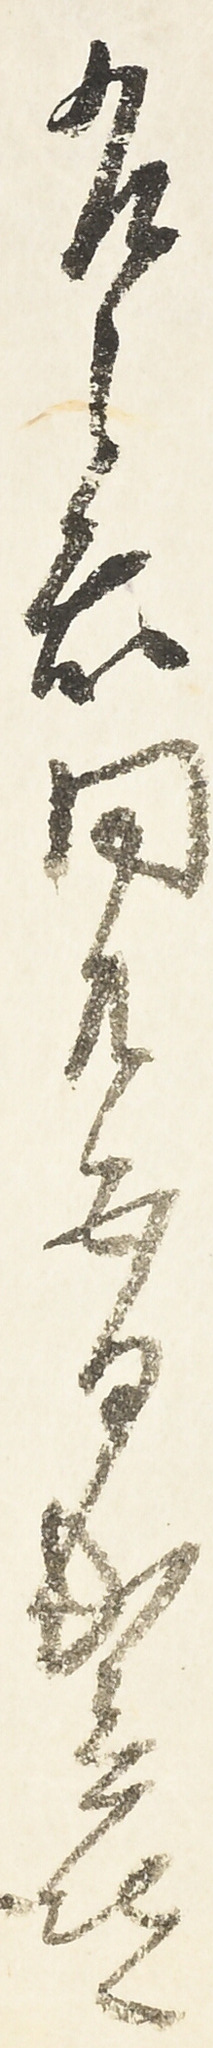右之者同廿五日出立仕候
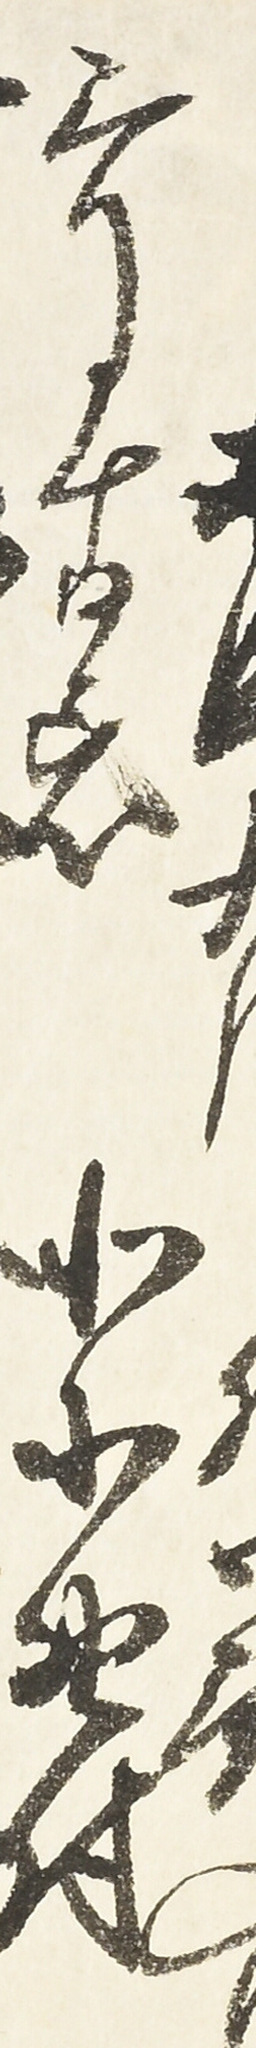三月十日着北小野村
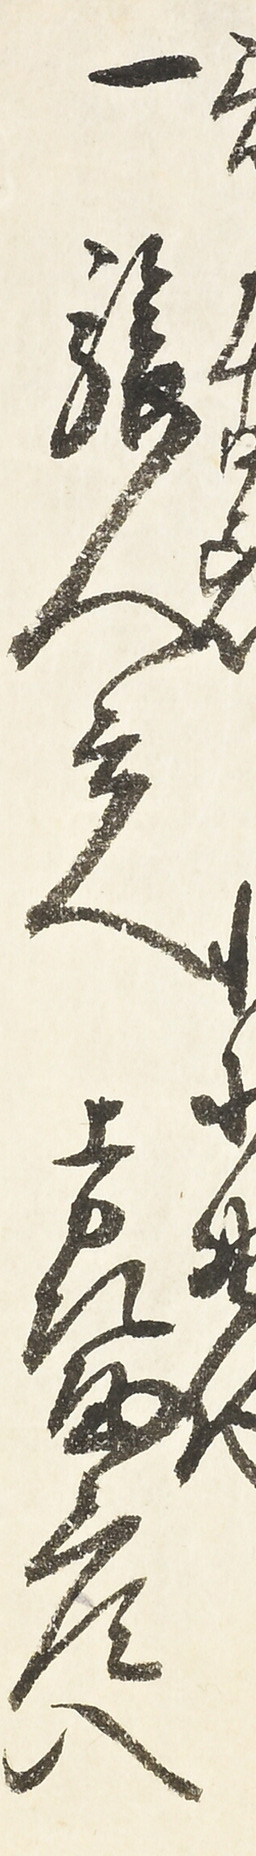一旅人壱人上州屋彦八
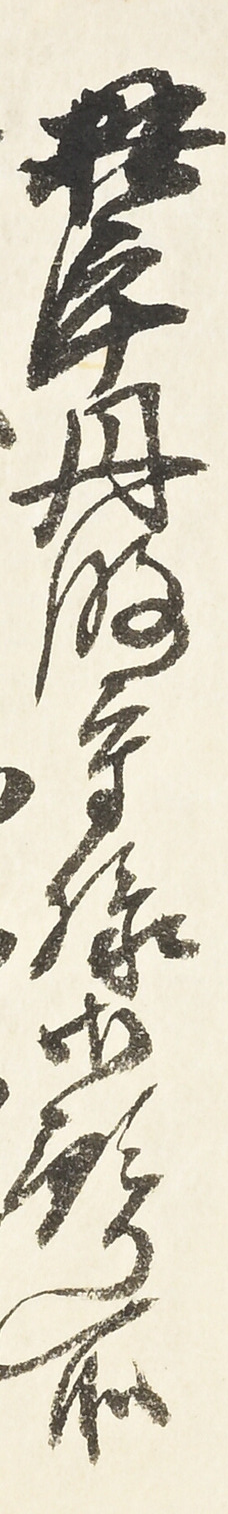松平丹波守様御預リ所
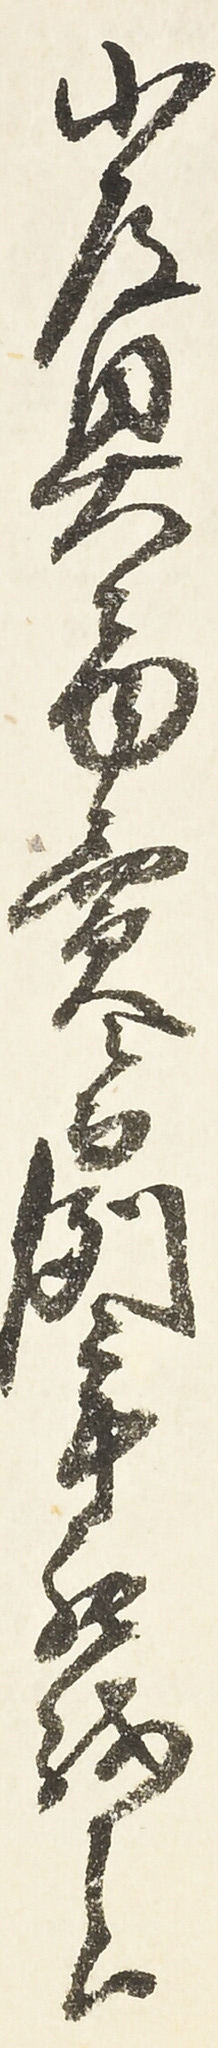小道具商売ニ而例年罷越申候
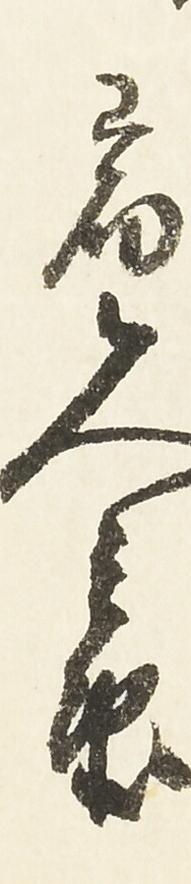宿久兵衛
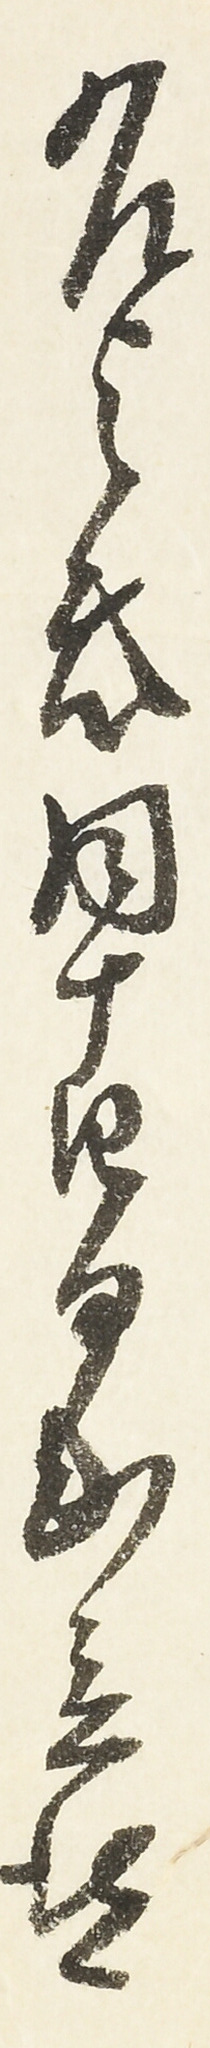右之者同十四日出立仕候
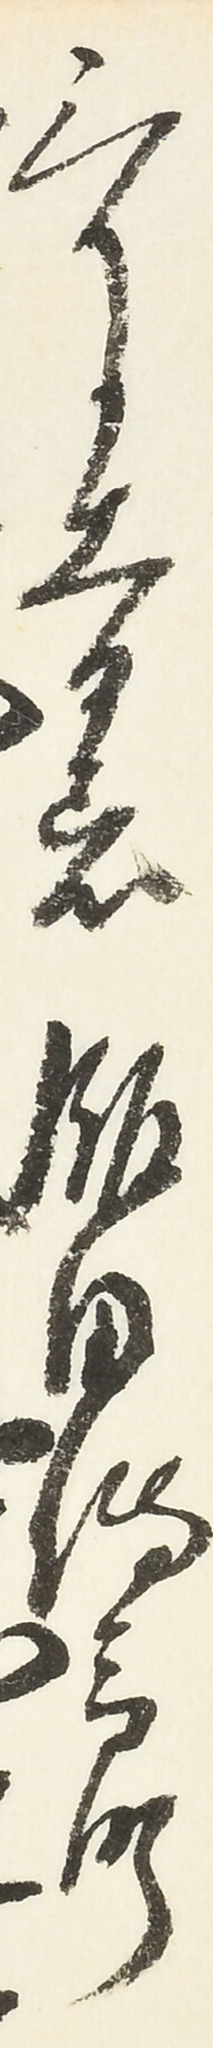三月十一日着飯田伝馬町
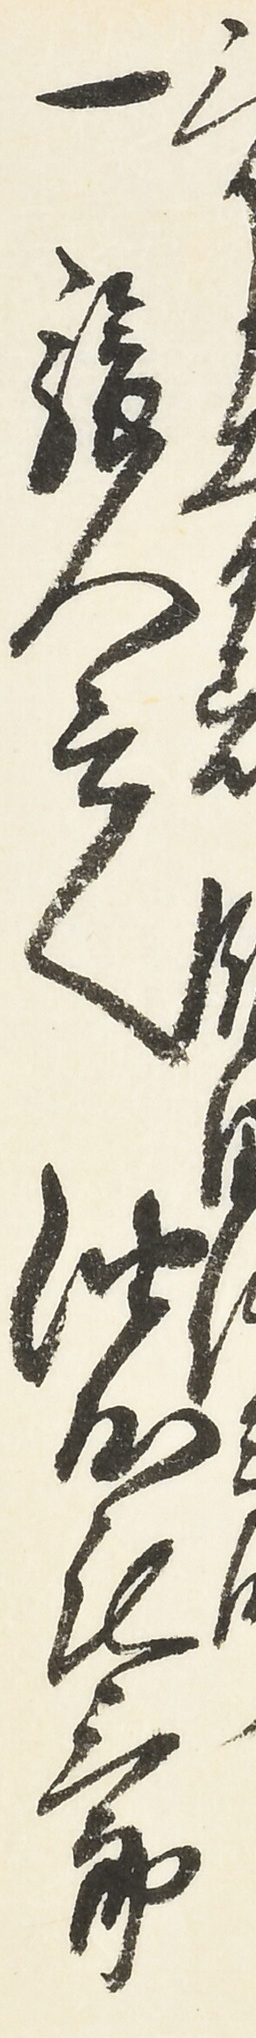一旅人壱人油屋庄三郎
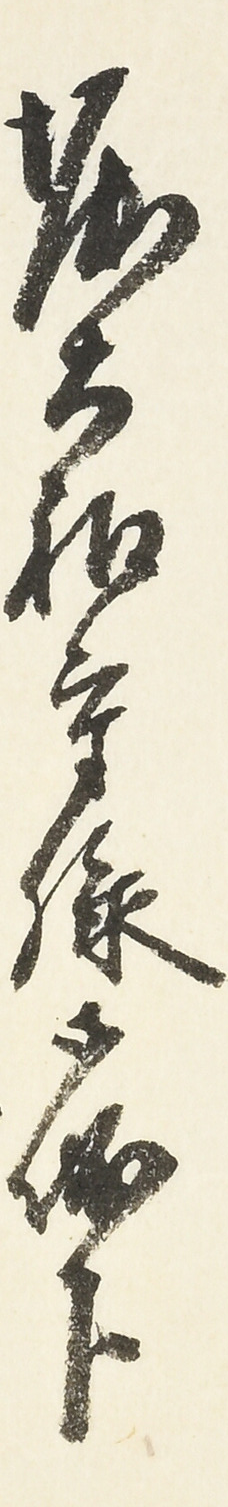堀大和守様御城下
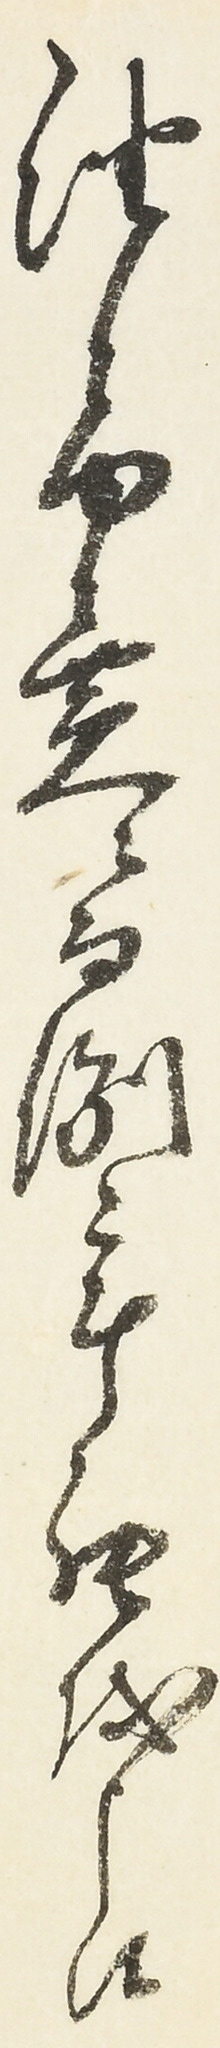油商売ニ而例年罷越申候
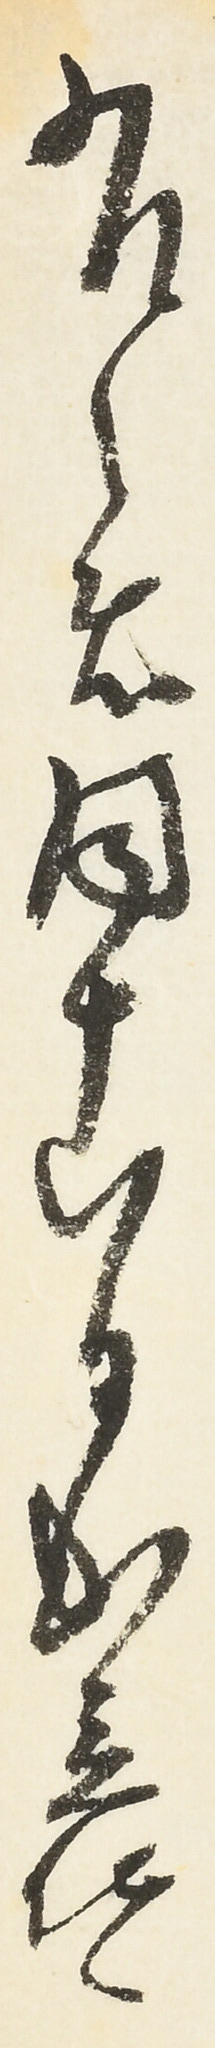右之者同十七日出立仕候

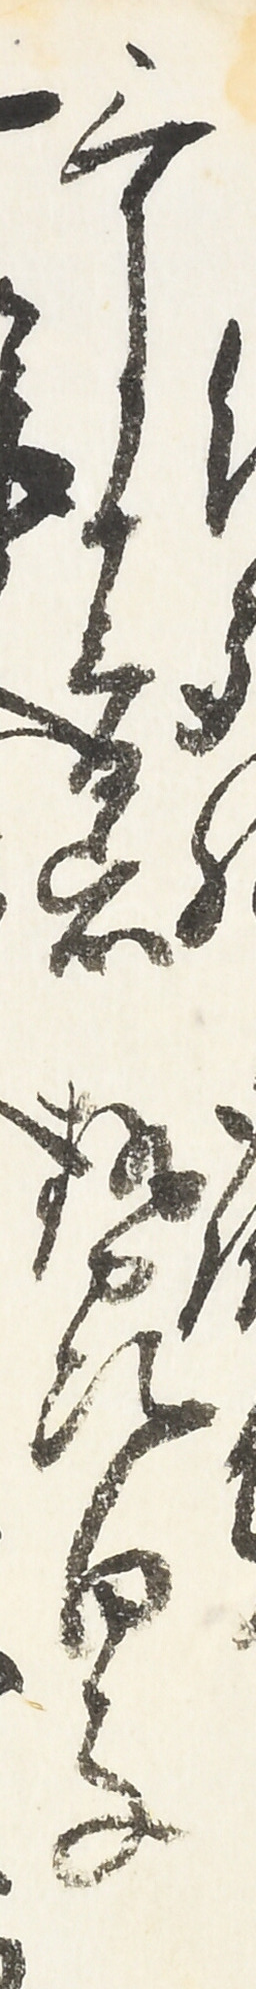三月十三日着勢州白子
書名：町中旅人泊控帳
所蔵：伊那市立高遠町図書館・合同会社AMANE
